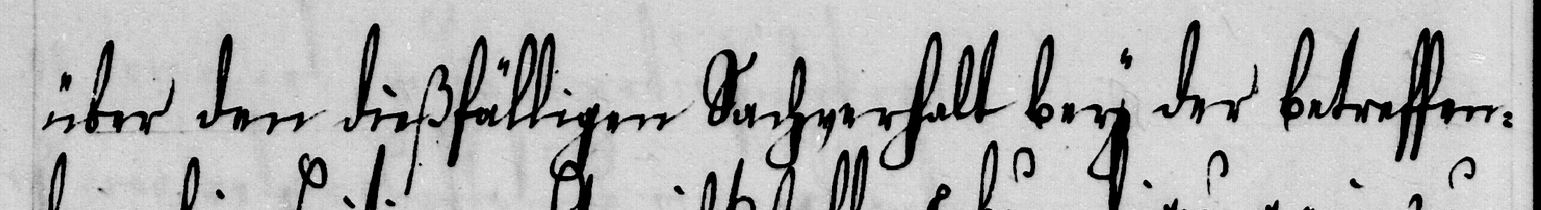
über den dießfälligen Sachverhalt bey der betreffe¬
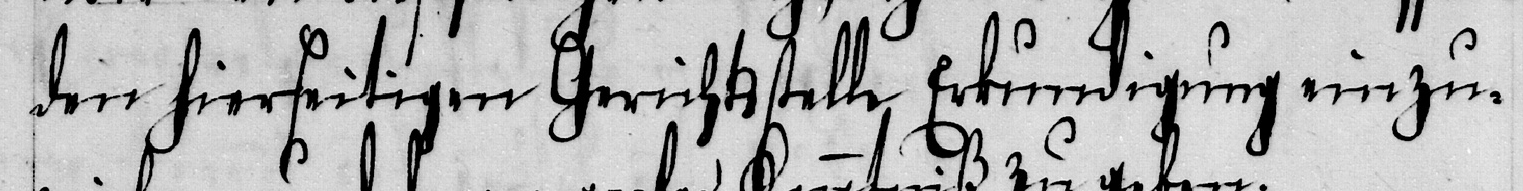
nden hierseitigen Gerichtsstelle Erkundigung einzu¬
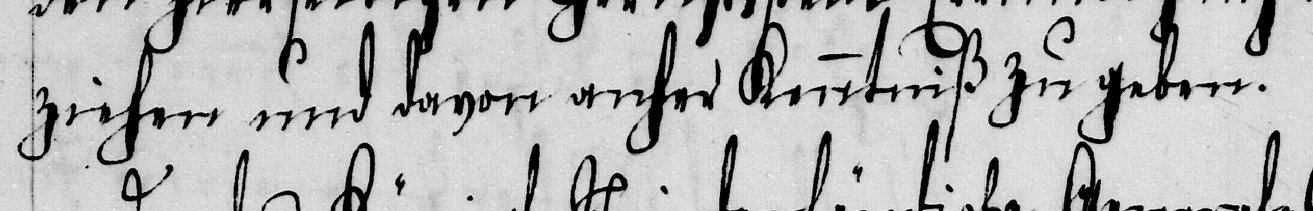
ziehen und davon anher Kenntniß zu geben.
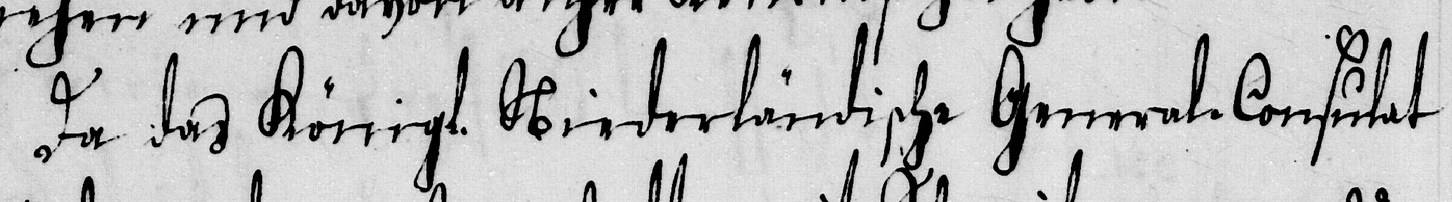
Da das Königl. Niederländische General-Consulat
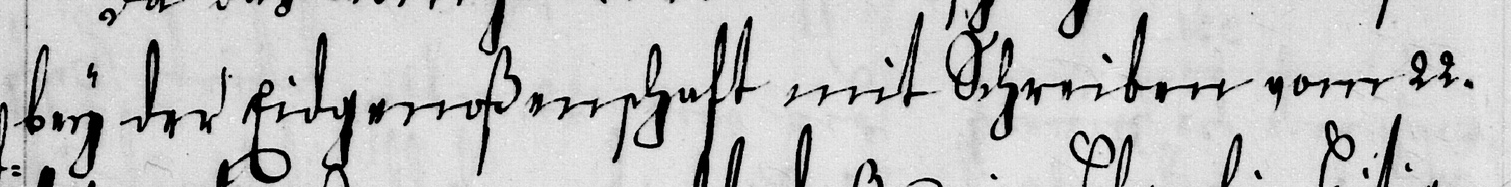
bey der Eidgenoßenschaft mit Schreiben vom 22.
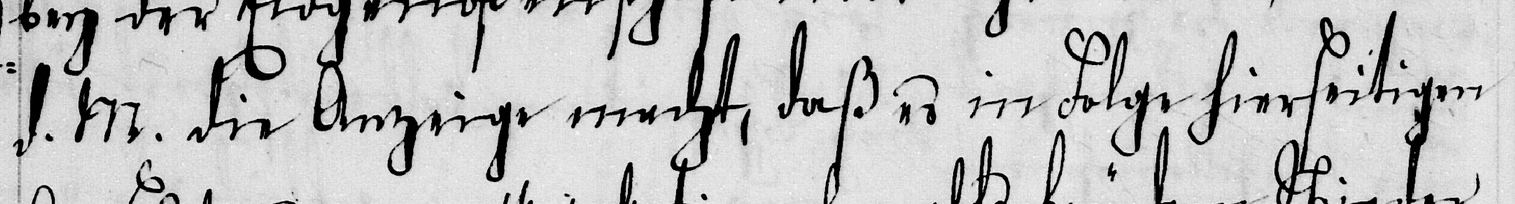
d. M. die Anzeige macht, daß es in Folge hierseitigen
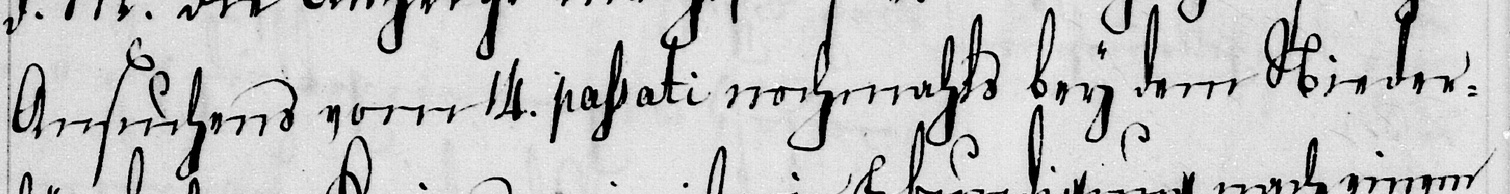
Ansuchens vom 14. passati nochmahls bey dem Nieder¬
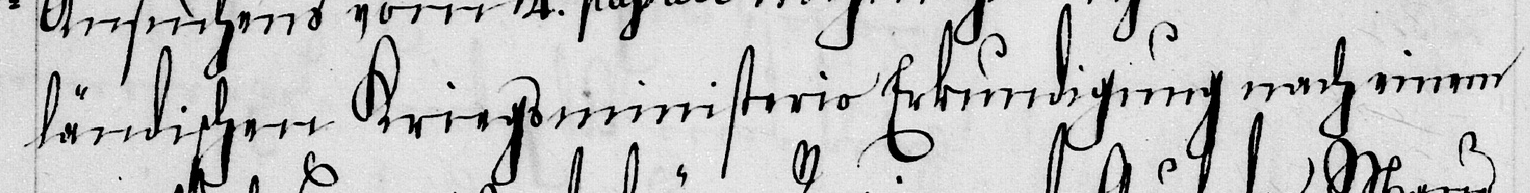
ländischen Kriegsministerio Erkundigung nach einem
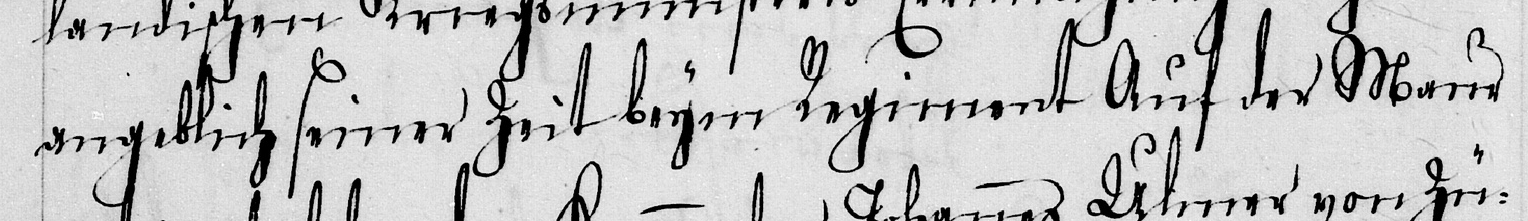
angeblich seiner Zeit beym Regiment Auf der Maur
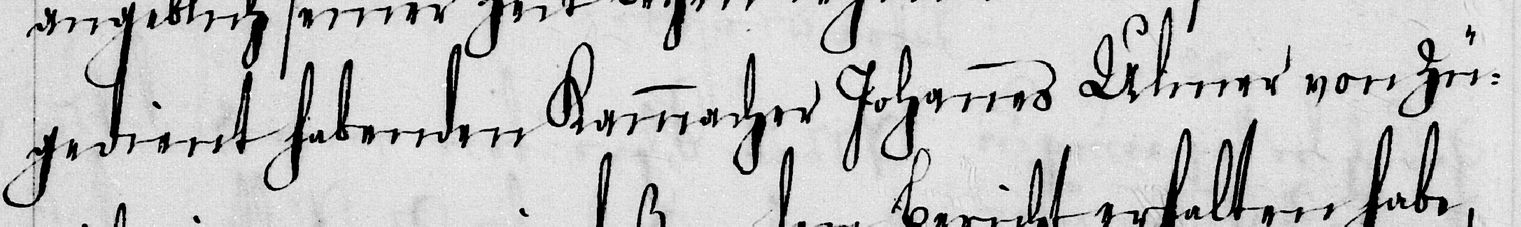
gedient habenden Kammacher Johannes Ulmer von Zü¬
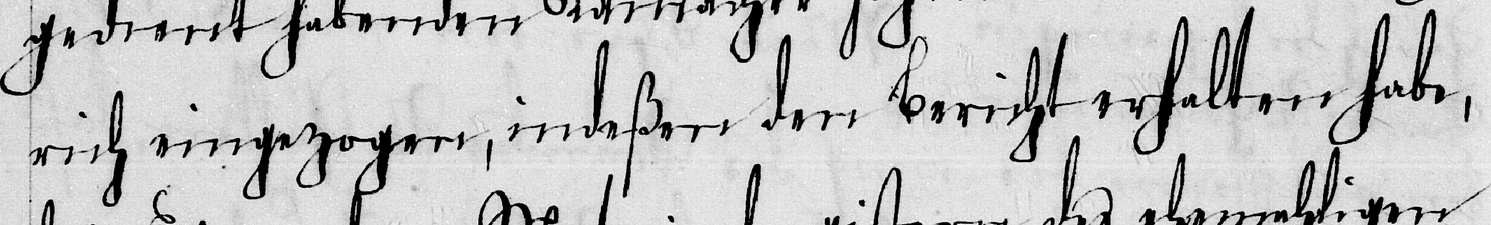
rich eingezogen, indeßen den Bericht erhalten habe,
